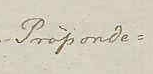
fang sondern
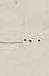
denen
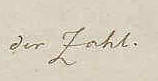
einen wahren
